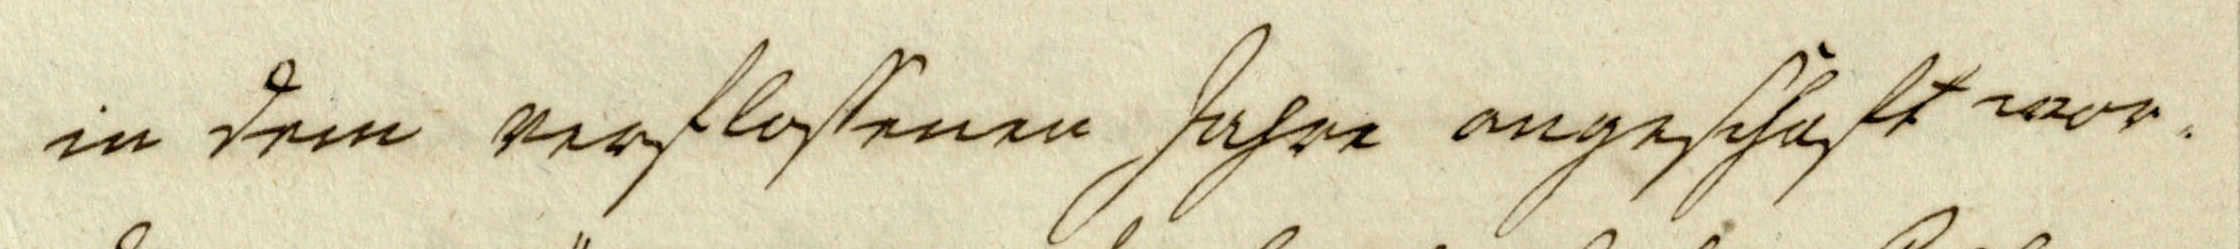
in dem verflossenen Jahre angeschaft wor¬
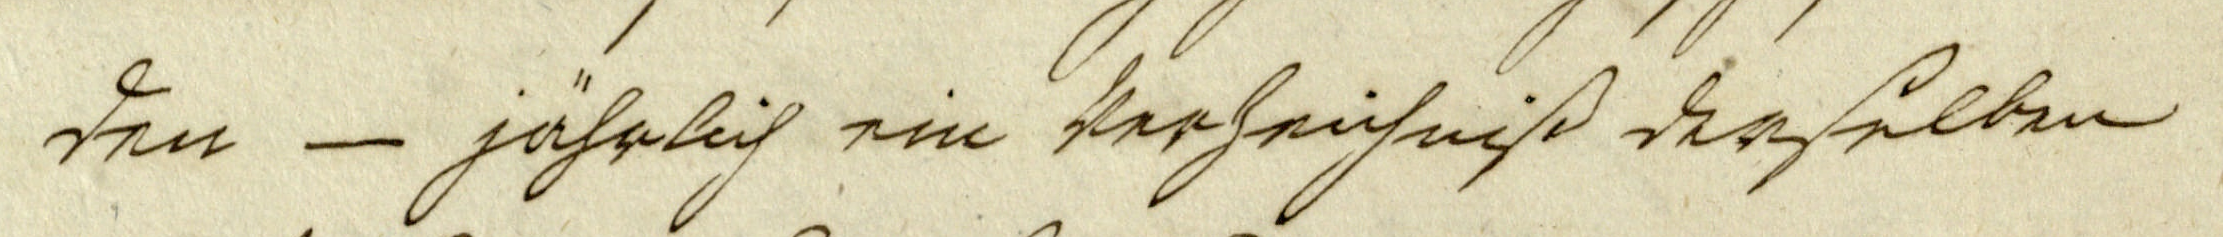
den jährlich ein Verzeichniß derselben
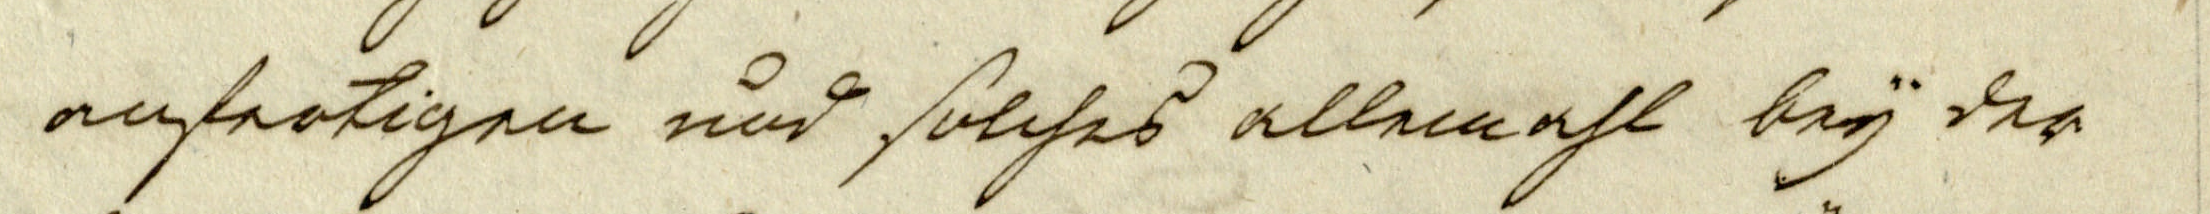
anfertigen und solches allemahl beÿ der
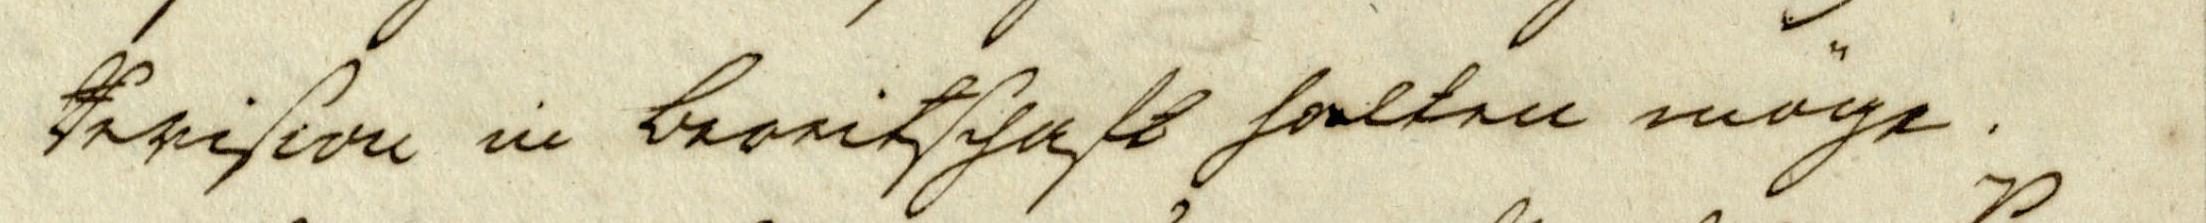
Revision in Bereitschaft halten möge.
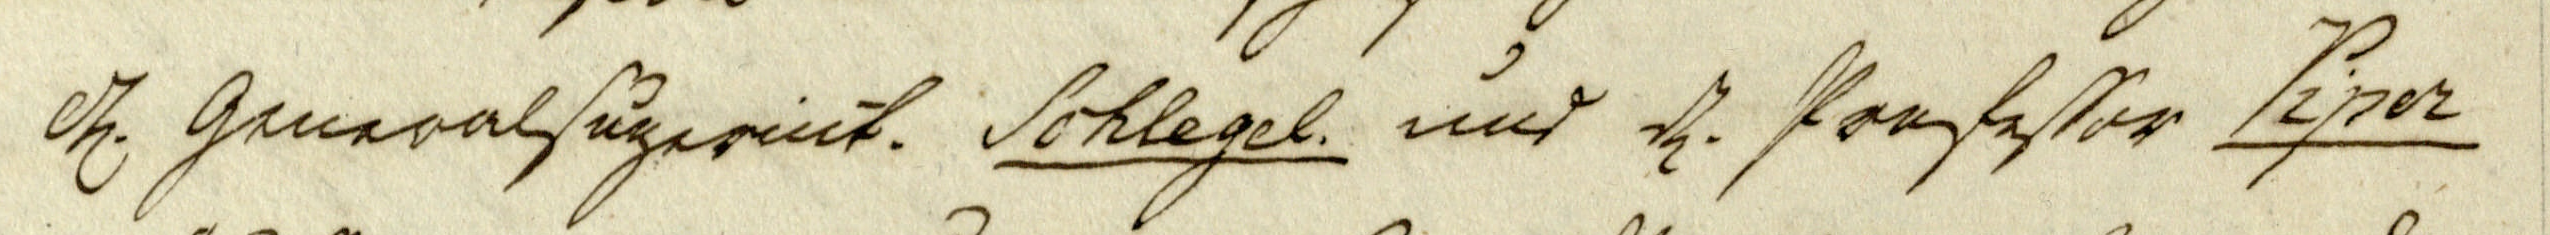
dh. Generalsuperint. Schlegel. und dh. Professor Piper
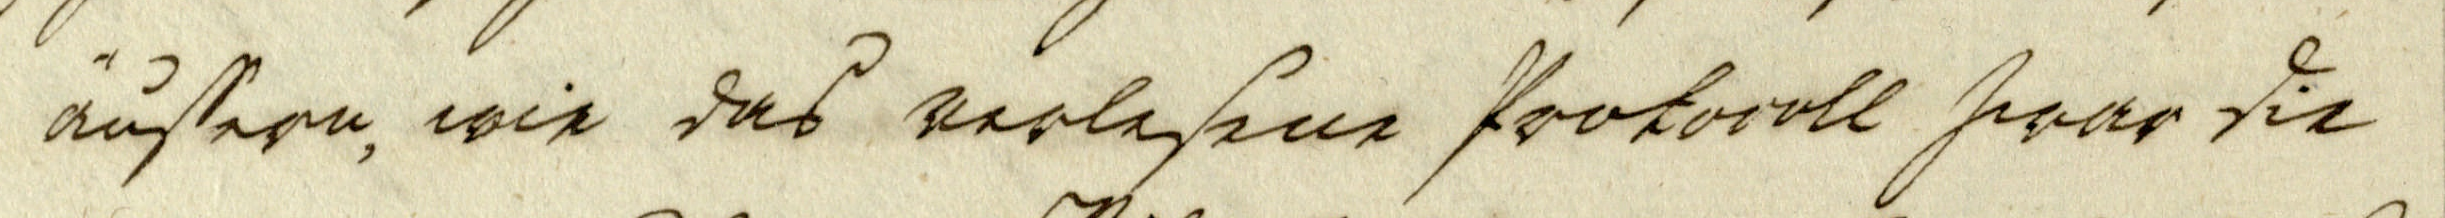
äussern, wie das verlesene Protocoll zwar die
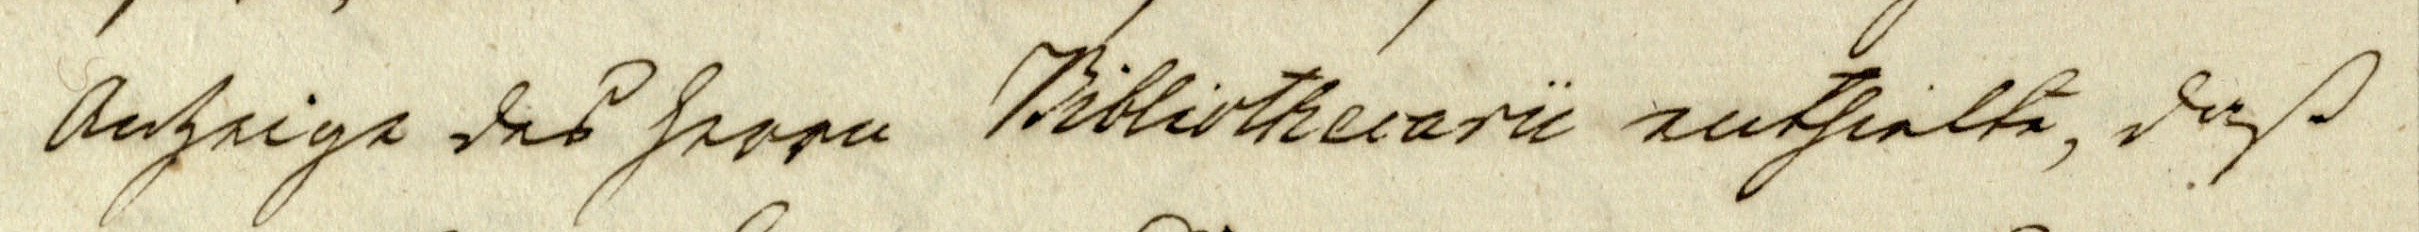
Anzeige des herrn Bibliothecarii enthielte, daß
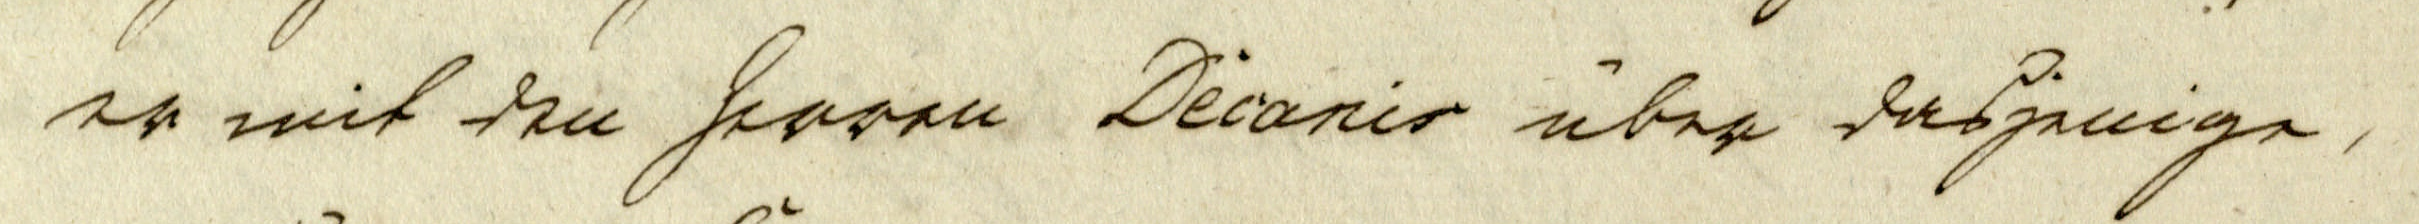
er mit den herren Decanis über dasjenige,
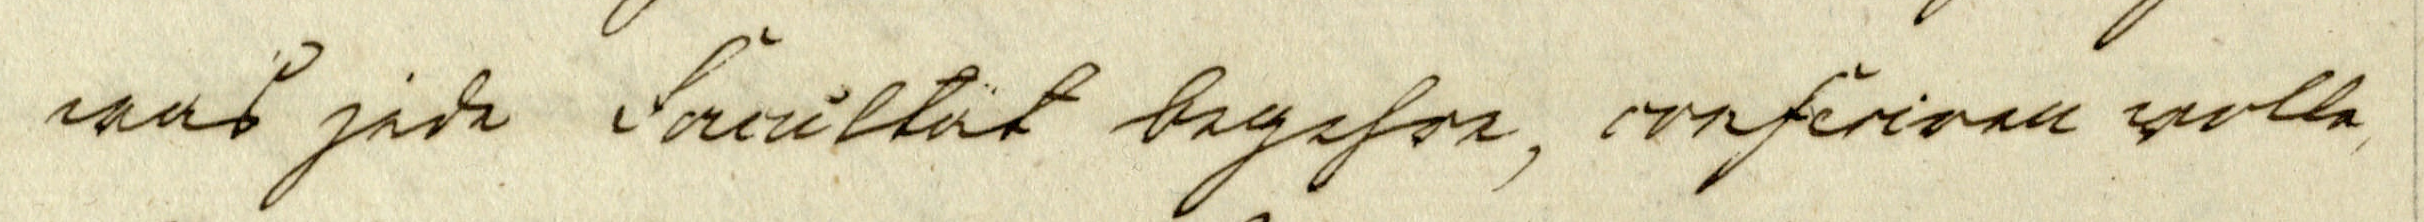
was jede Facultät begehre, conferiren wolle,
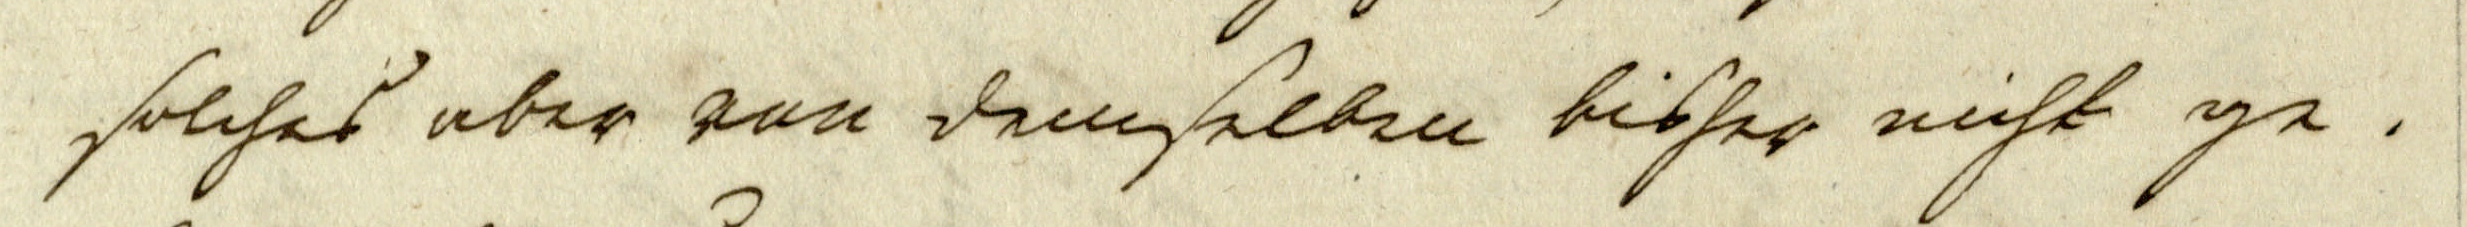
solches aber von demselben bisher nicht ge¬
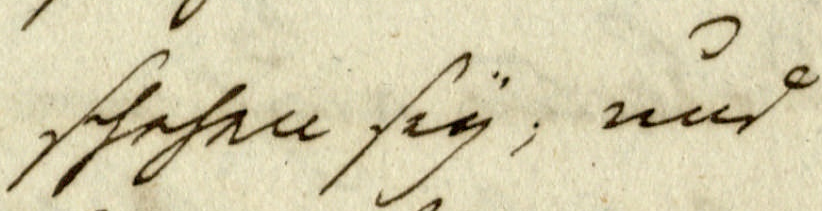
schehen seÿ, und
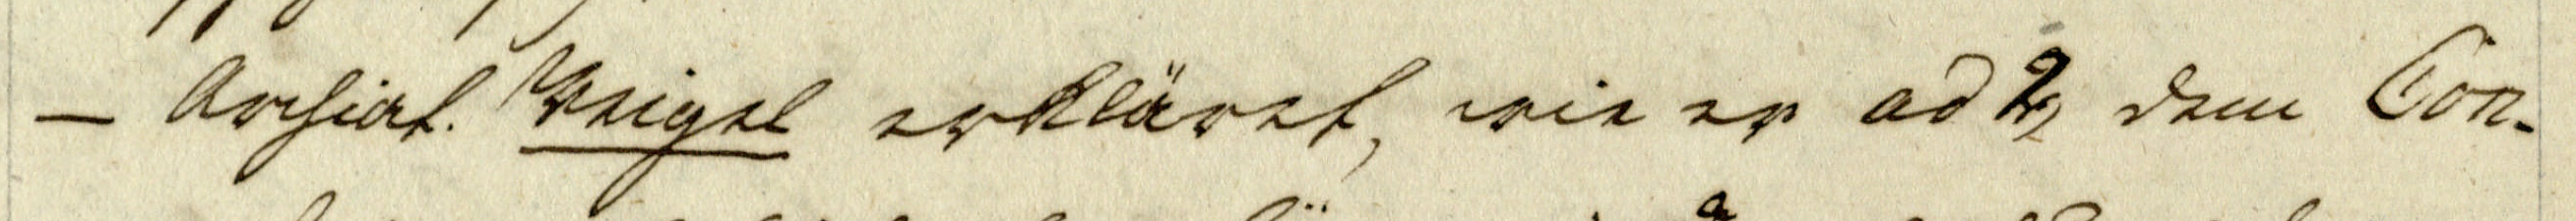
Archiat. Weigel erkläret, wie er ad 2, dem Con¬
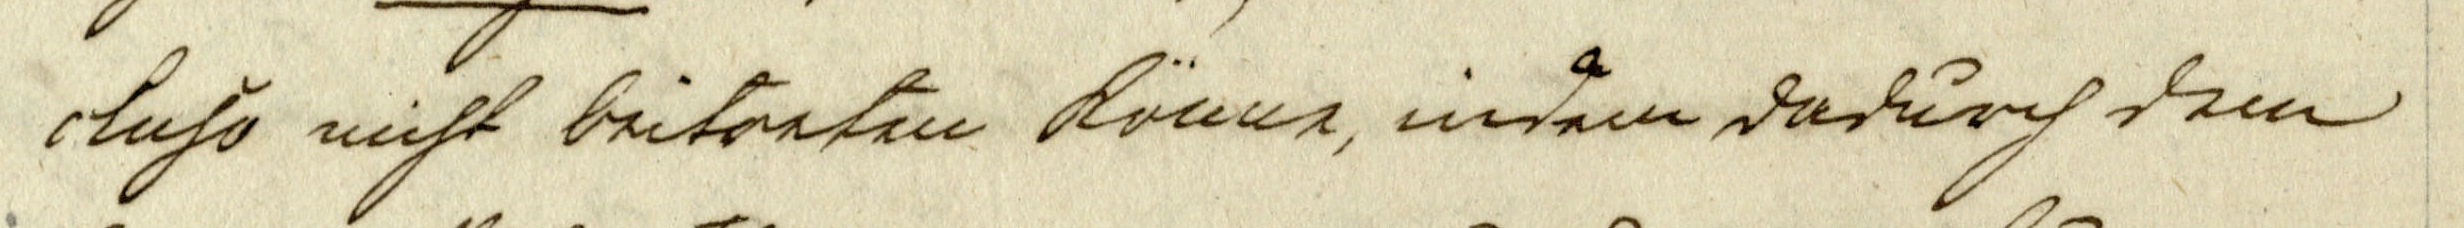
cluso nicht beitreten könne, indem dadurch dem
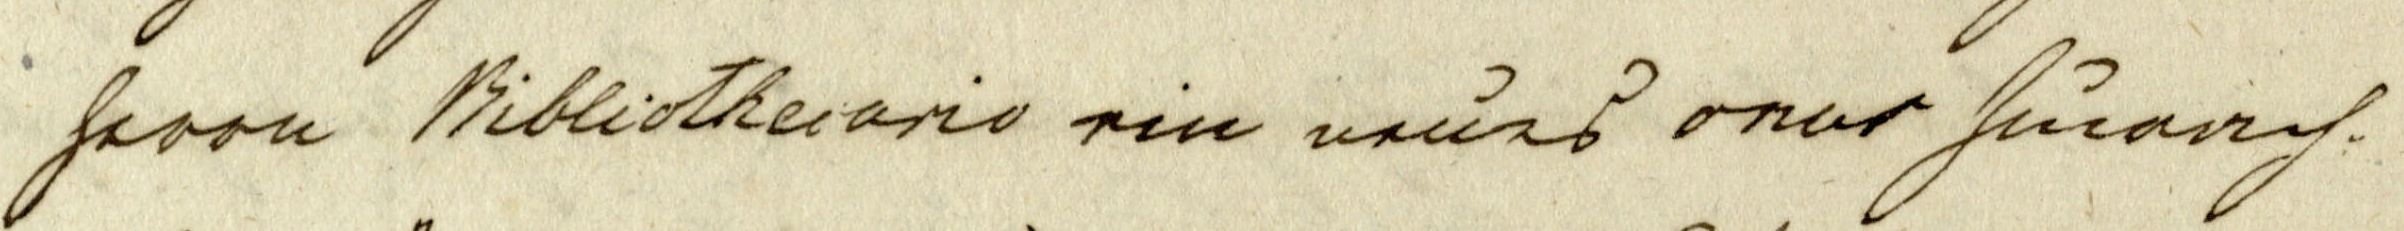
herrn Bibliothecario ein neues onus zuwach¬
